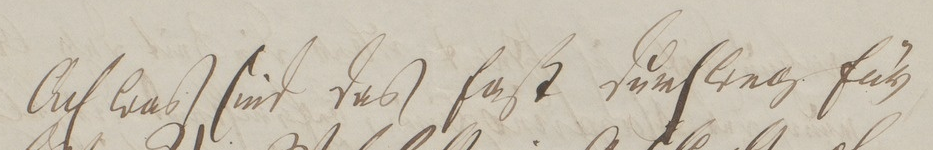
Ach was sind das fast durchweg für
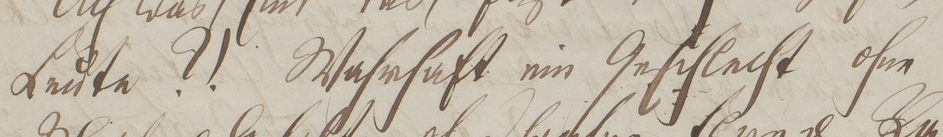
Leute?! Wahrhaft ein Geschlecht ohne
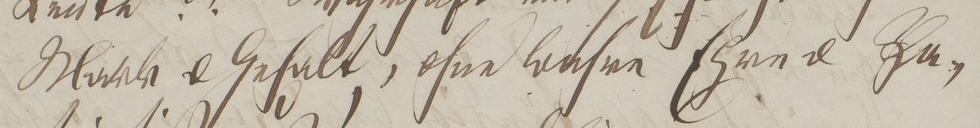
Mark & Gehalt, ohne wahre Ehre & Pa-
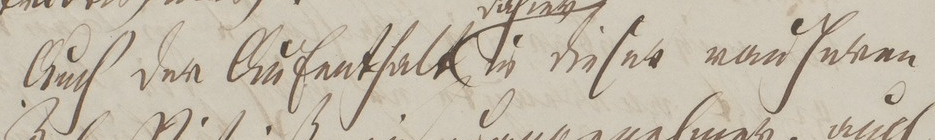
Auch der Aufenthalt dahier in dieser rauheren
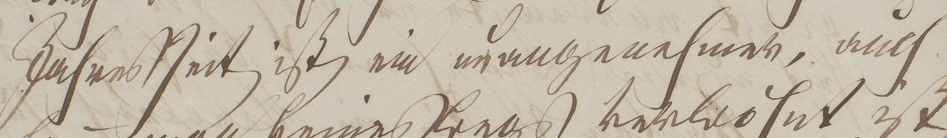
Jahreszeit ist ein unangenehmer, auch
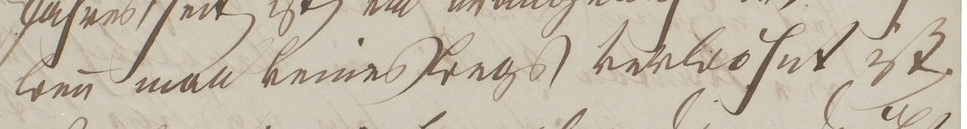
wenn man keineswegs verwöhnt ist.
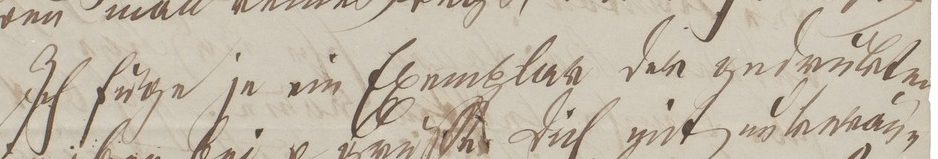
Ich füge je ein Exemplar der gedrukten
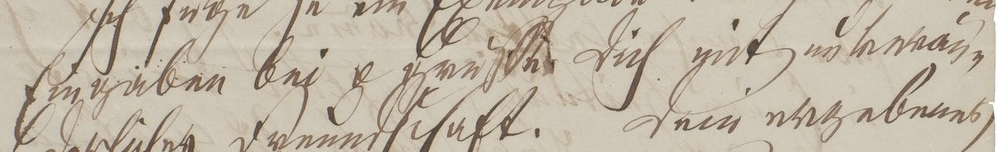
Eingaben bei & grüsse Dich mit unverän-
